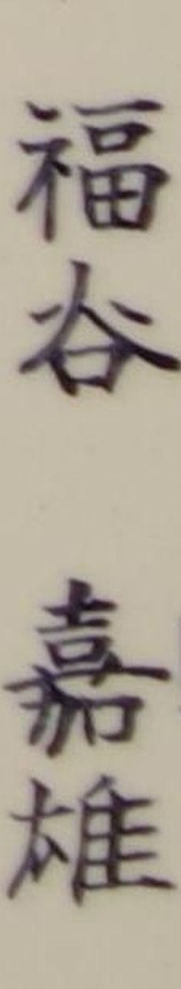福谷嘉雄
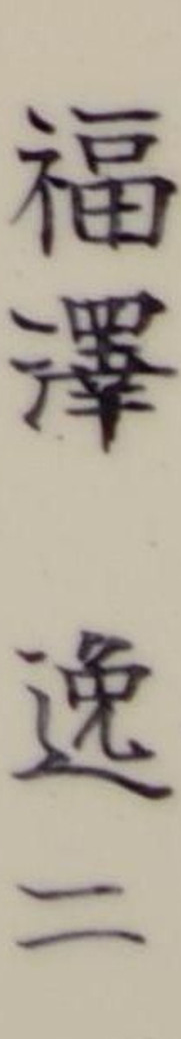福澤逸二
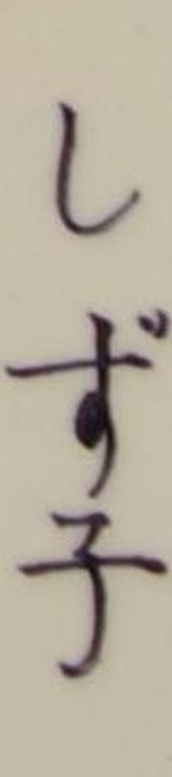しず子
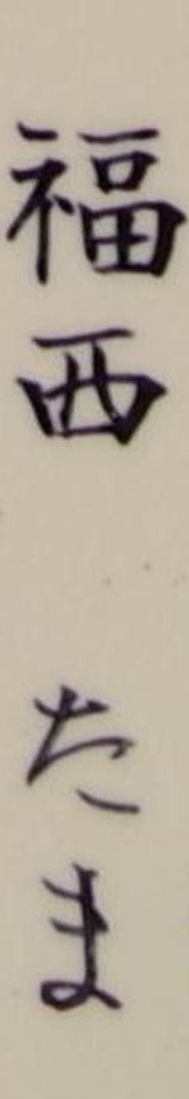福西たま
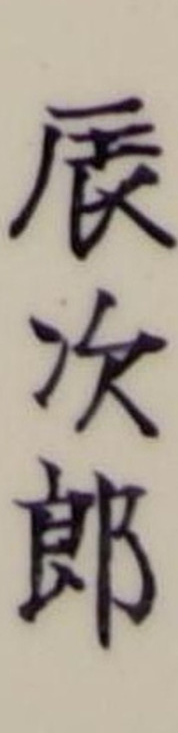辰次郎
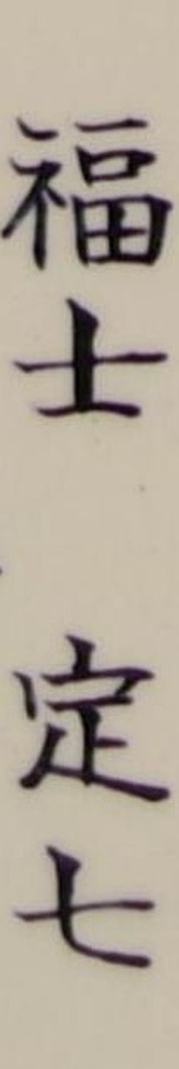福士定七
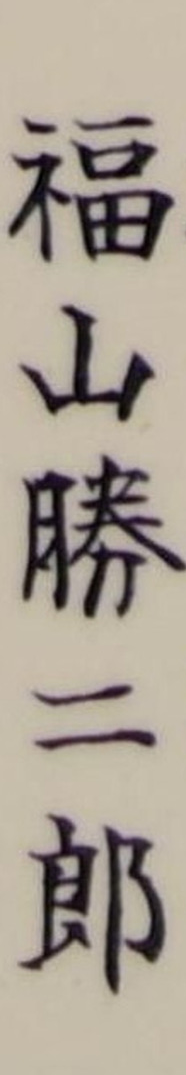福山勝二郎
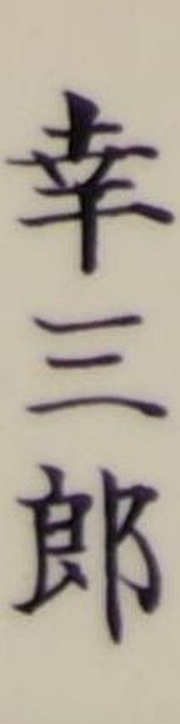幸三郎
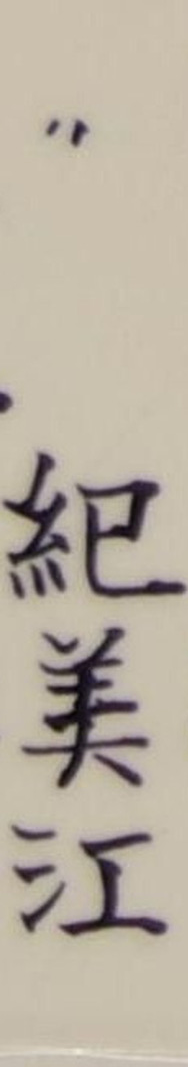紀美江
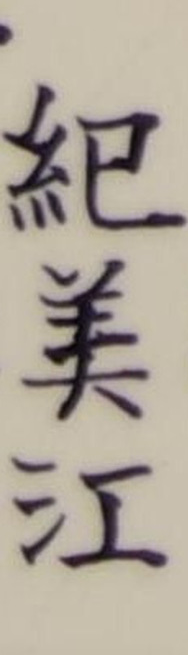紀美江
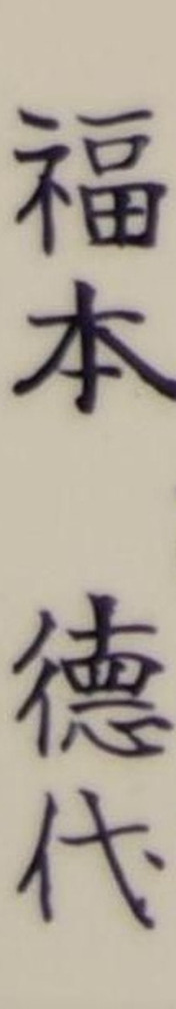福本徳代

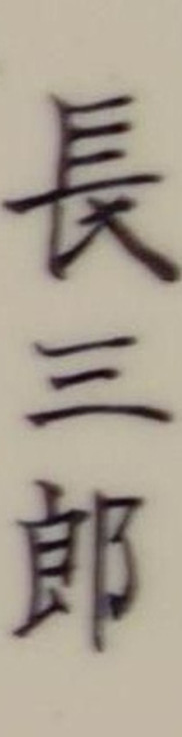長三郎
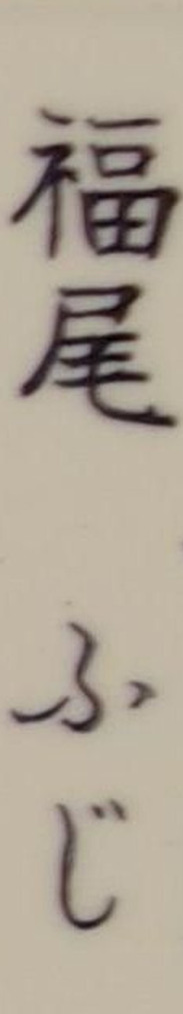福尾ふじ
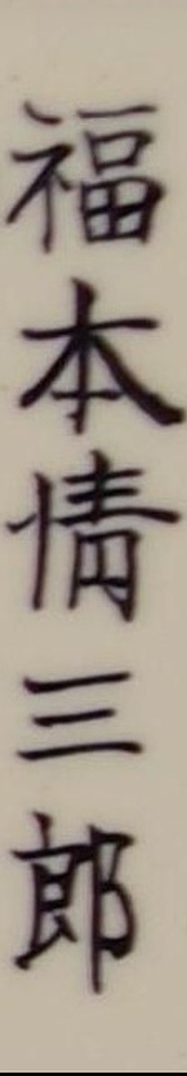福本情三郎
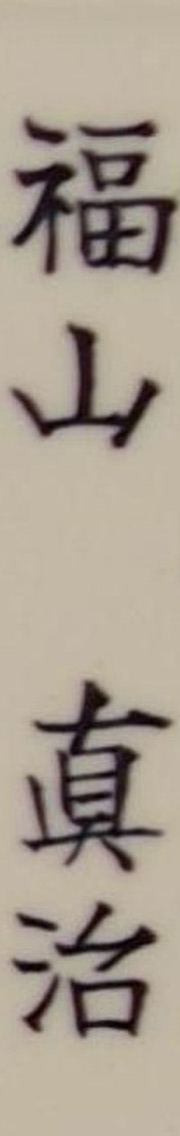福山真治
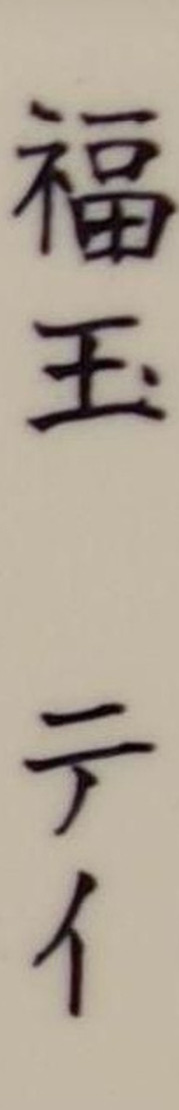福玉テイ
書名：E~L
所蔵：高野山金剛峯寺
